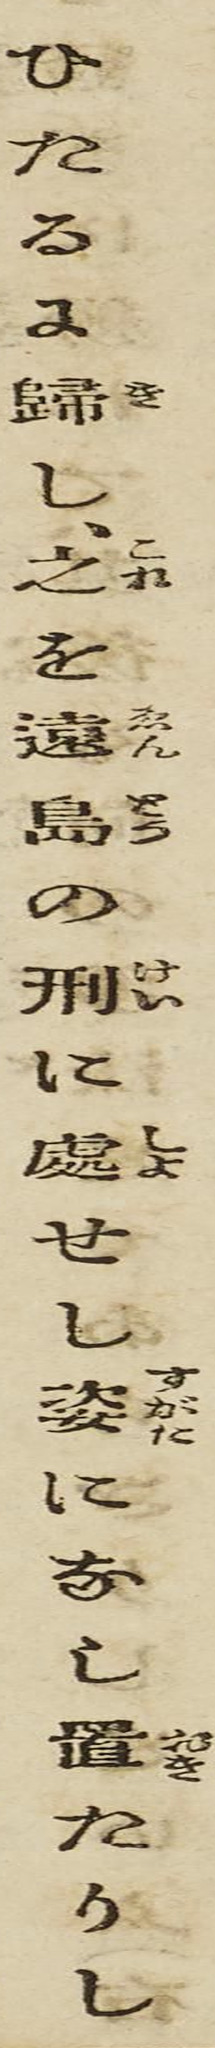ひたるに帰し、之を遠島の刑に処せし姿になし置たりし
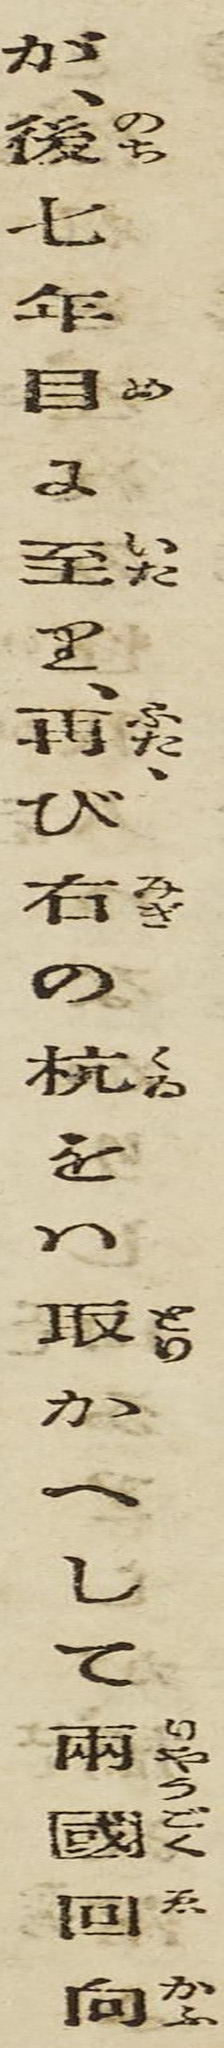が、後七年目に至り、再び右の杭をは取かへして両国回向
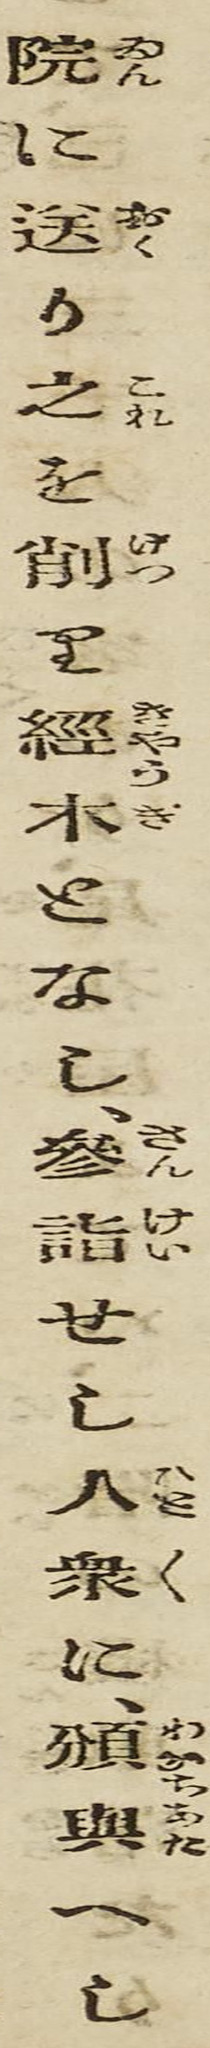院に送り之を削り経木となし、参詣せし人衆に、頒与へし
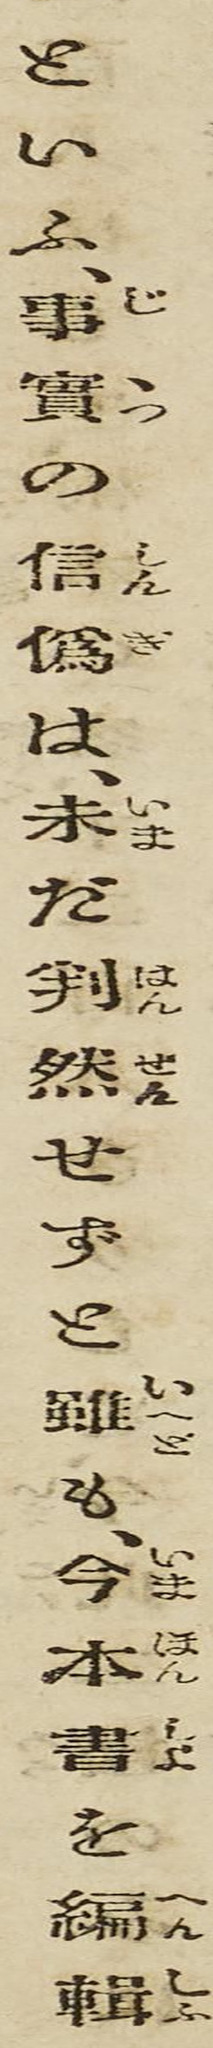といふ、事実の信偽は、未だ判然せずと雖も、今本書を編輯
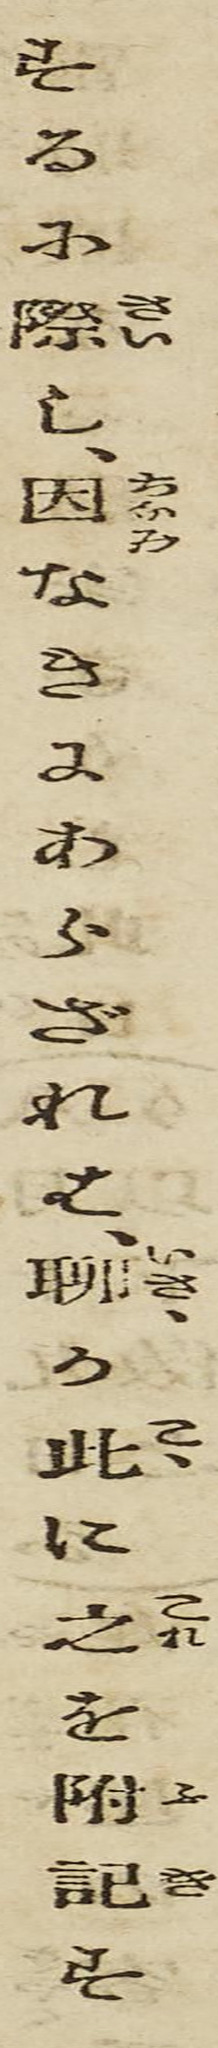するに際し、因なきにあらざれは、聊か此に之を付記す
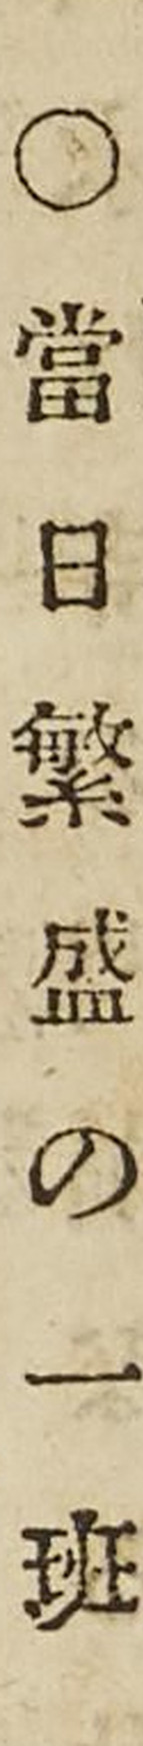○当日繁盛の一班

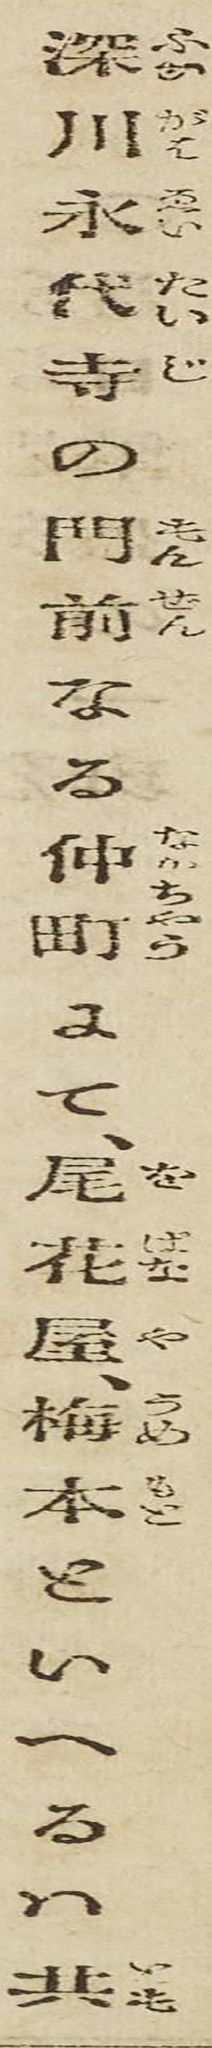深川永代寺の門前なる仲町にて、尾花屋、梅本といへるは共
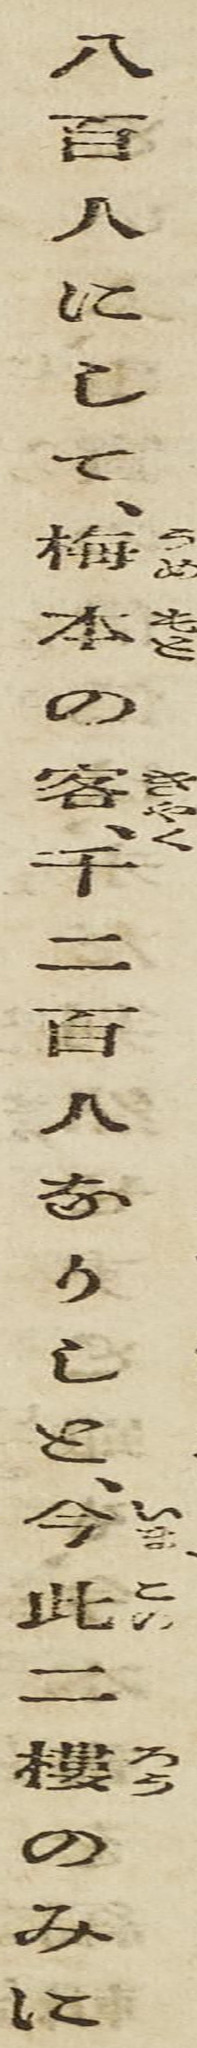八百人にして、梅本の客、千二百人なりしと、今此二楼のみに
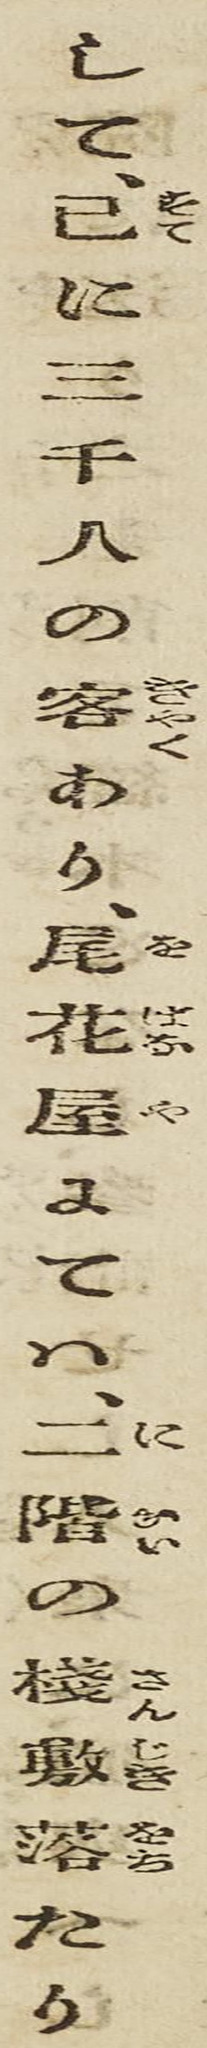して、已に三千人の客あり、尾花屋にては、二階の桟敷落たり
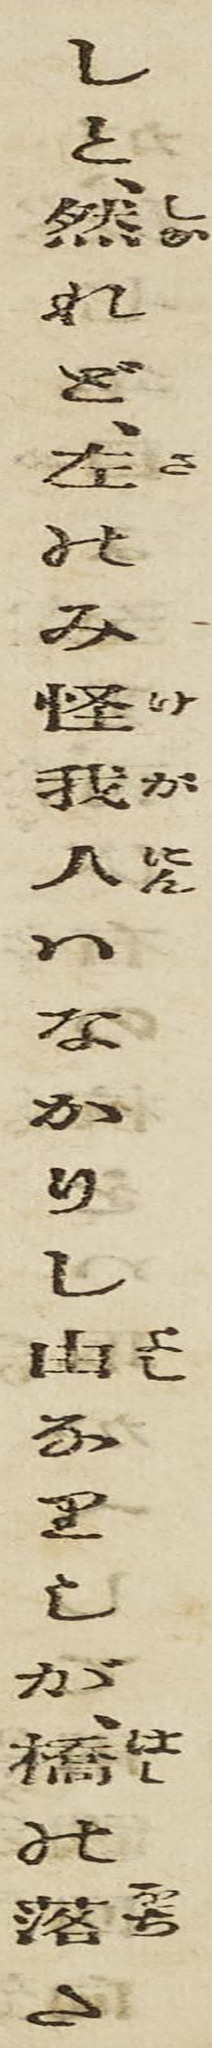しと、然れど、左のみ怪我人はなかりし由なりしが、橋の落た
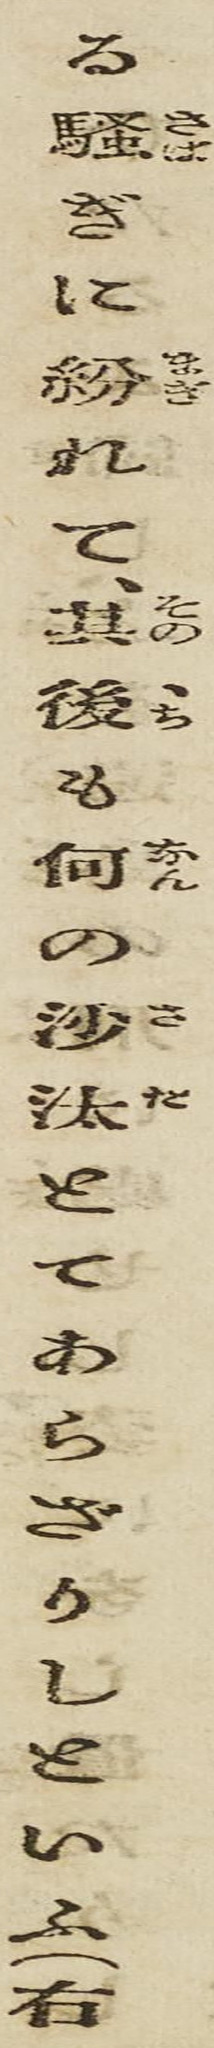る騒ぎに紛れて、其後も何の沙汰とてあらざりしといふ（右
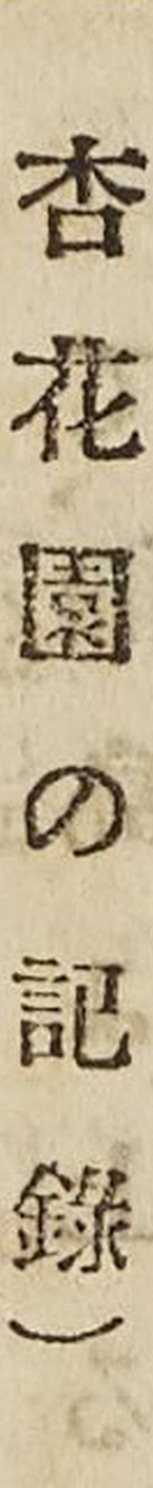杏花園の記録）
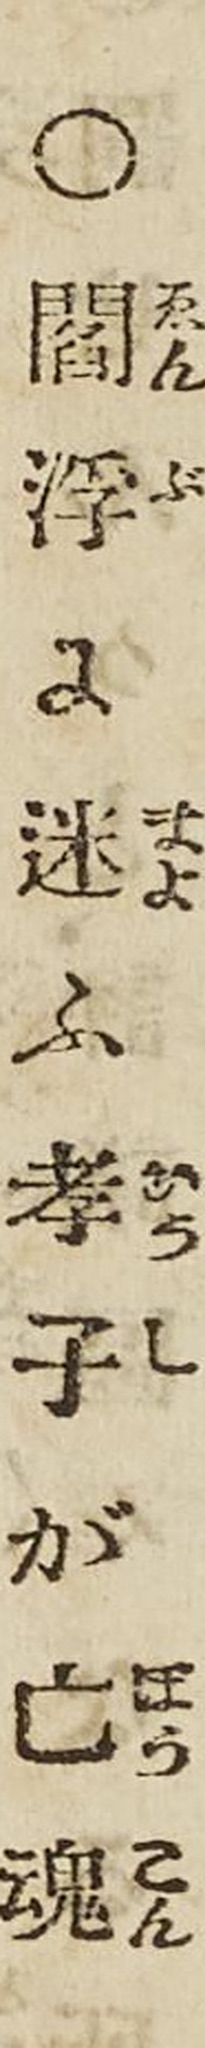○閻浮に迷ふ孝子が亡魂
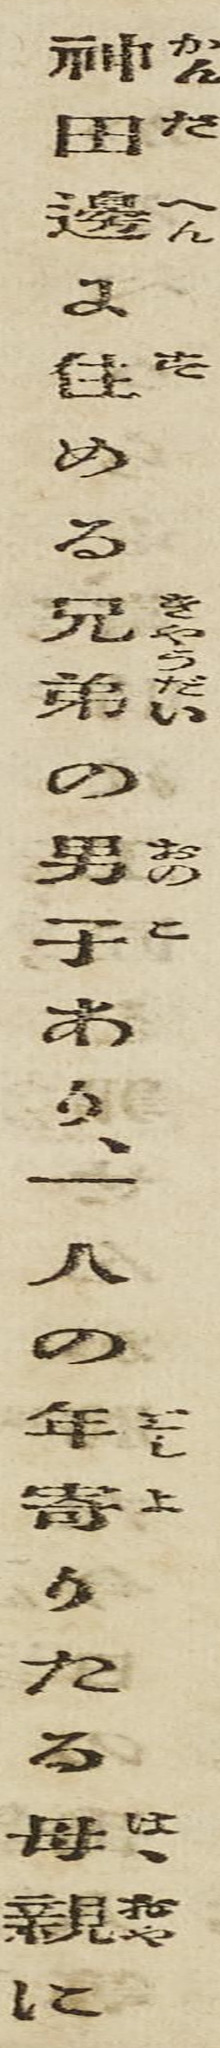神田辺に住める兄弟の男子あり、一人の年寄りたる母親に
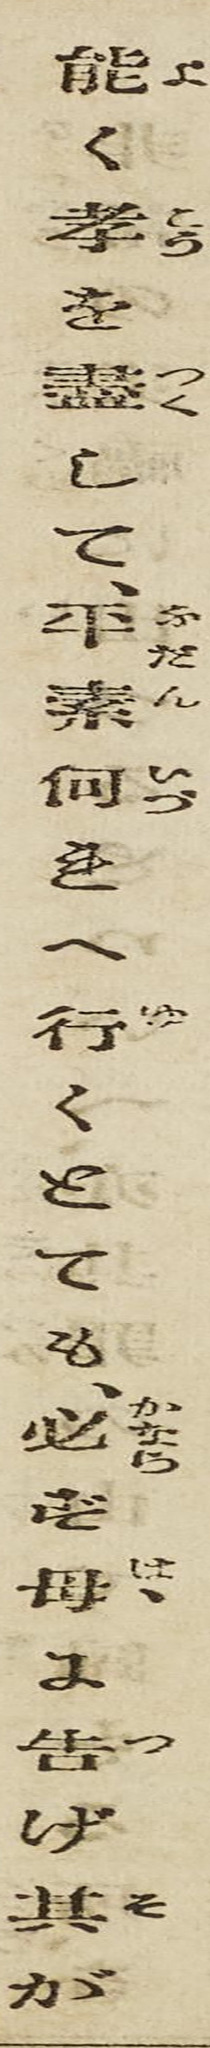能く孝を尽して、平素何れへ行くとても、必ず母に告げ其が
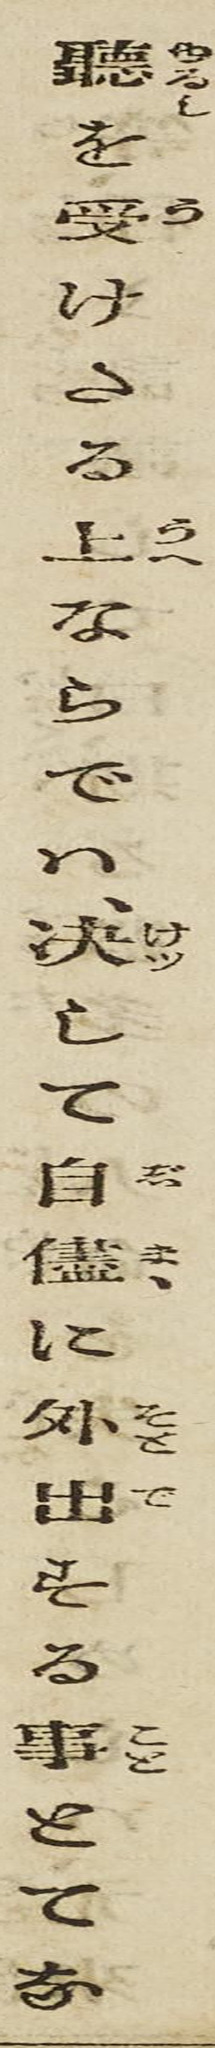聴を受けたる上ならでは、決して自侭に外出する事とてな
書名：永代惨話　文化の夢　全
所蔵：東京大学地震研究所図書室 Earthquake Research Institute Library, The University of Tokyo, JAPAN
